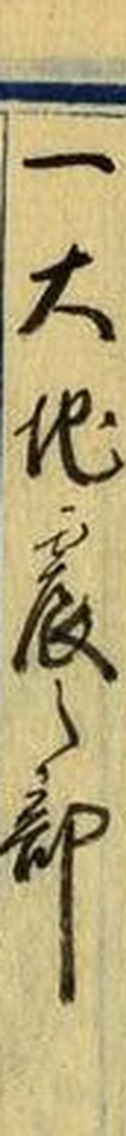一大地震之部
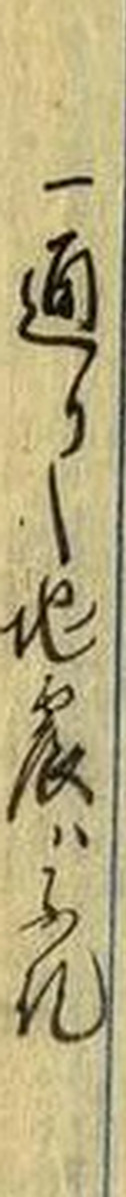一通り之地震ハ不記
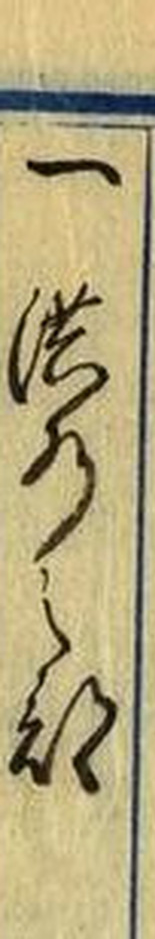一洪水之部
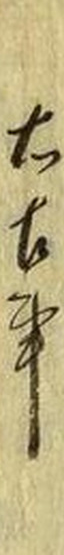右古事
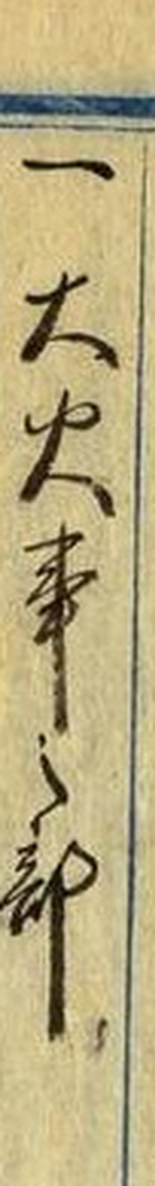一大火事之事
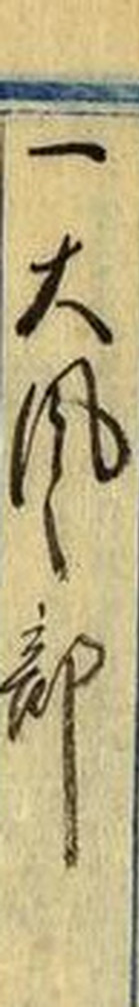一大風之部

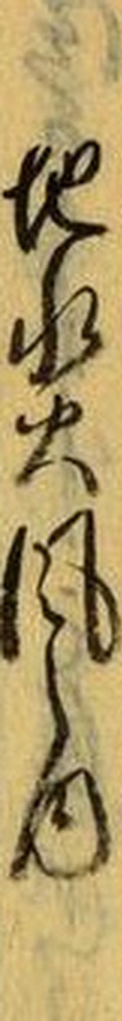地水火風之内
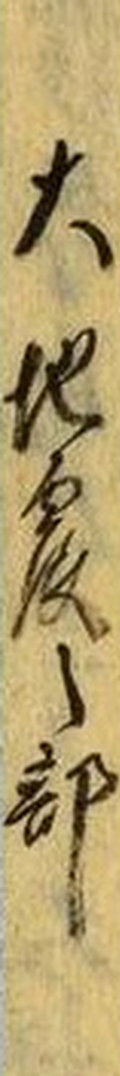大地震之部
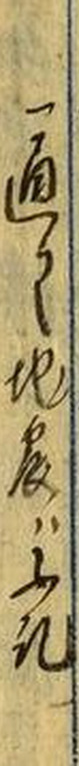一通り之地震ハ不記
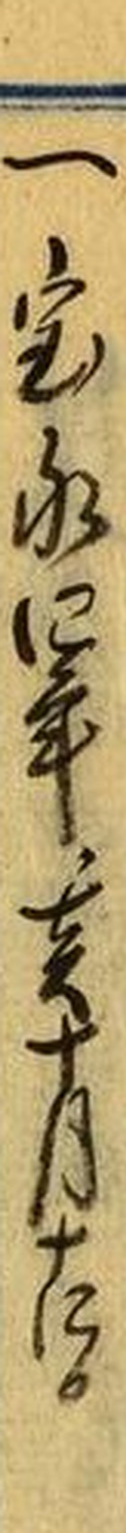一宝永四年亥十月十四日
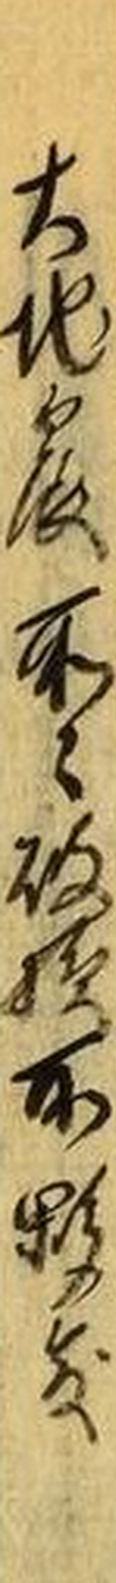大地震所々破損所夥敷
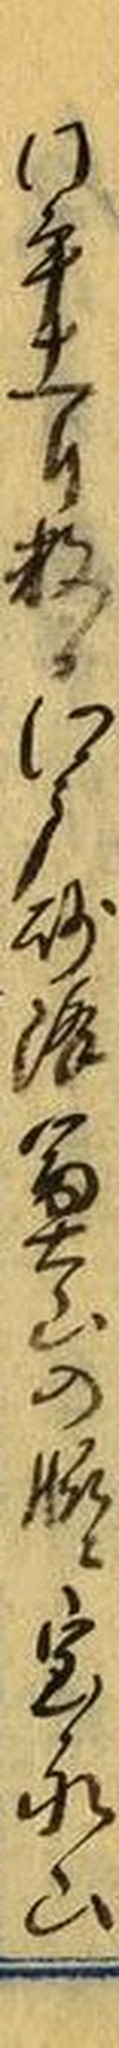同年十一月数日江戸砂降富士山の脇ニ宝永山
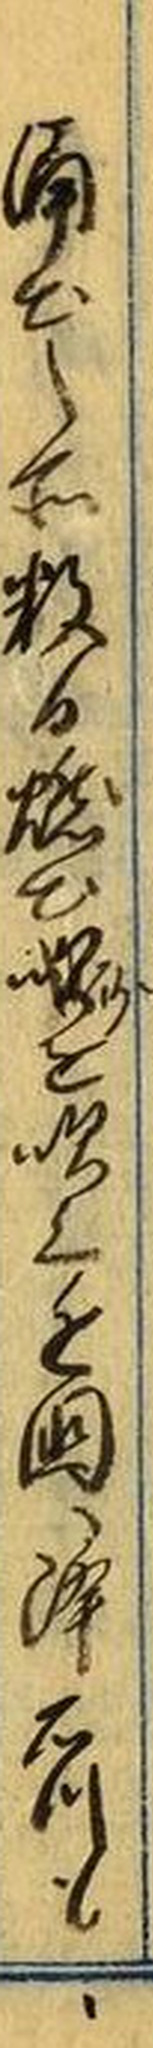涌出之所数日燃出砂を吹上近国へ降石川も
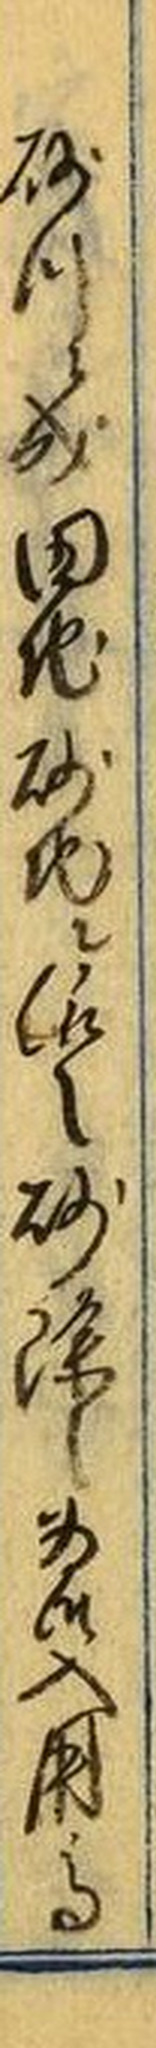砂川ニ成田地砂地ニ依之砂除之為御入用高
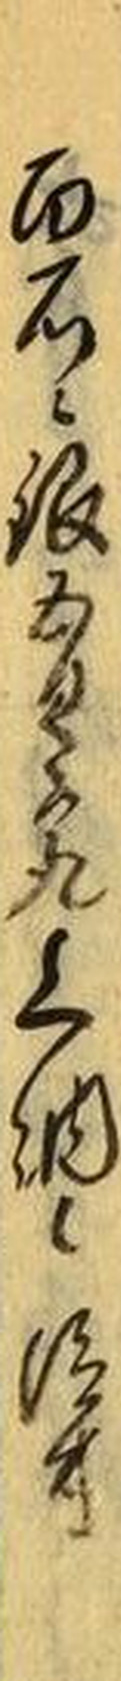百石二銀五匁宛上納被仰付

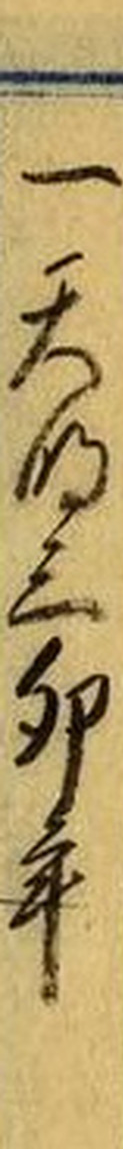一天明三卯年
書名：温古集 五巻
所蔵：福井県文書館 Fukui Prefectural Archives
